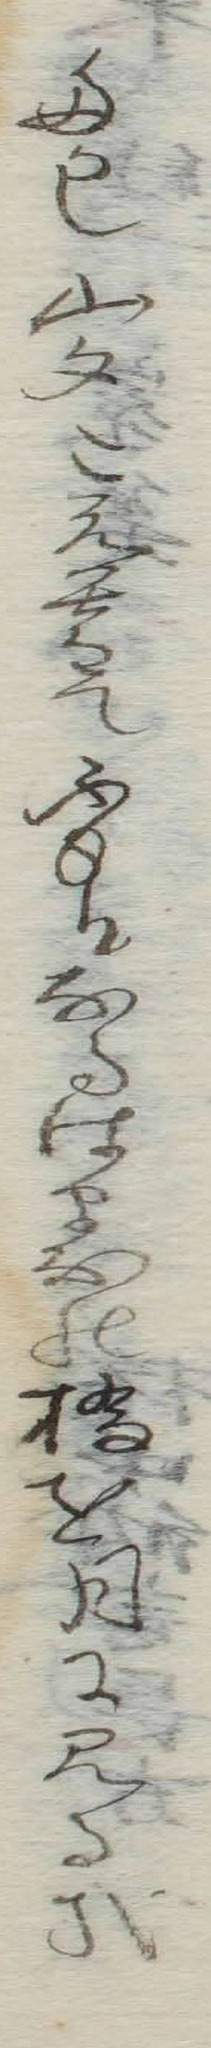たかし山夕こえ暮てふもとなるはまなの橋を月に見る哉

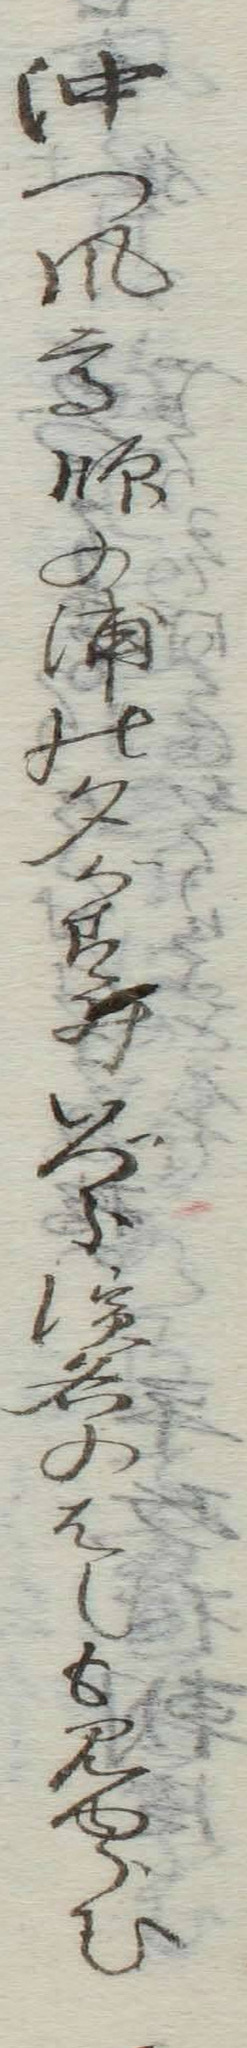沖つ風高師の浦の夕がすみいづら浜名のはしも見ゆらむ
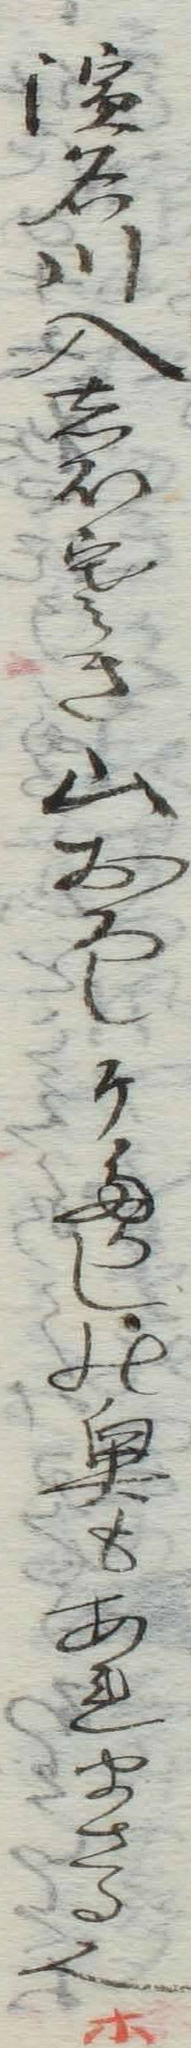浜名川入しほ寒き山おろしにたかしの奥もあれまさる也ホ
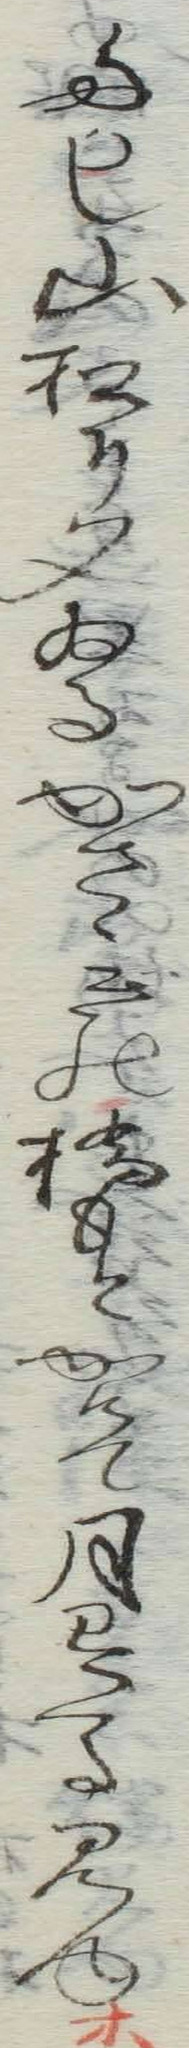たかし山松に夕ゐるかさゝぎの橋もとかけて月わたる見ゆホ
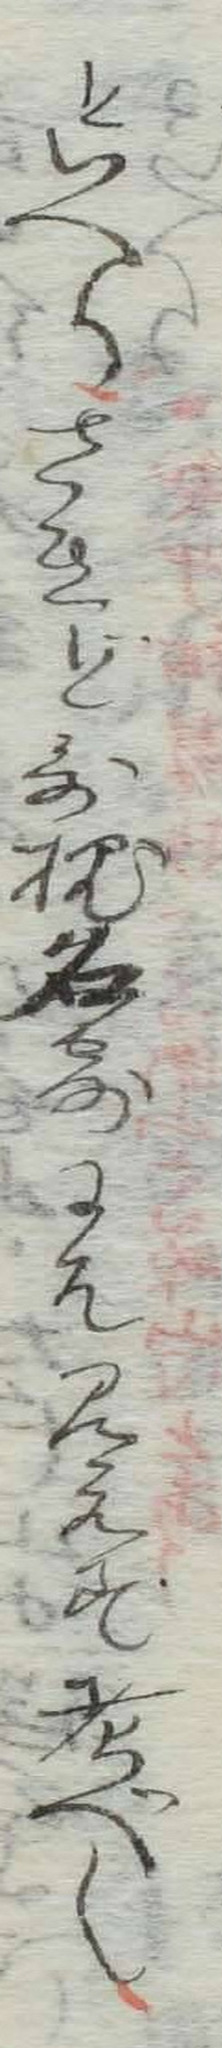といへりされど歌枕名寄には見えず考べし、
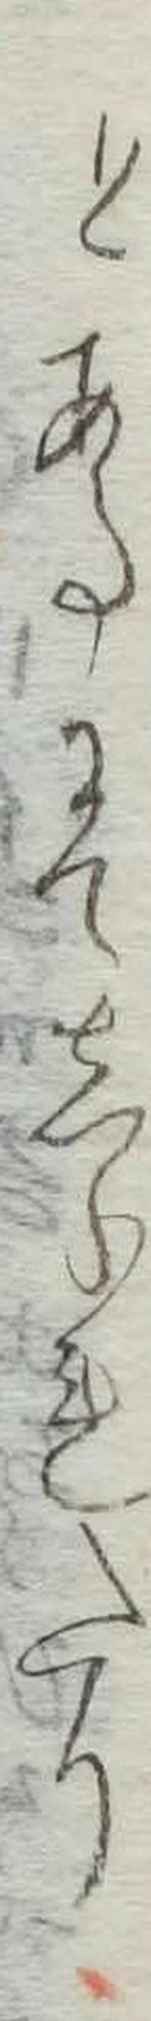とあるにてしられたり、
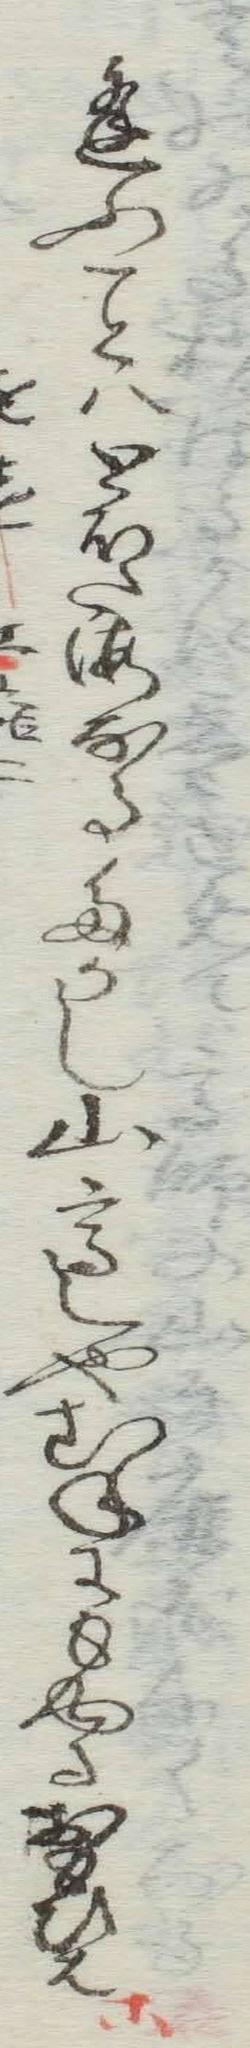逢ふことはとほた海なるたかし山高しやむねにもゆるおもひはホ
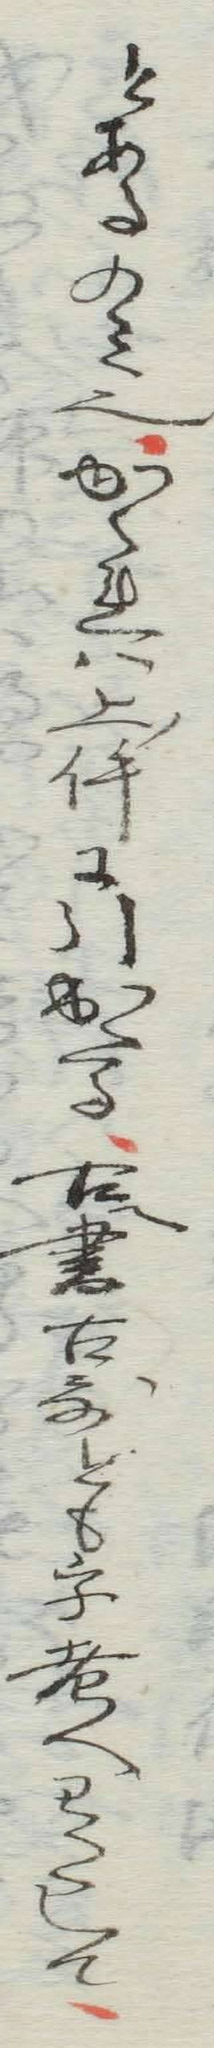とあるのみ也、かゝれは上件に引出たる、古へ書古歌どもを考へわたして、
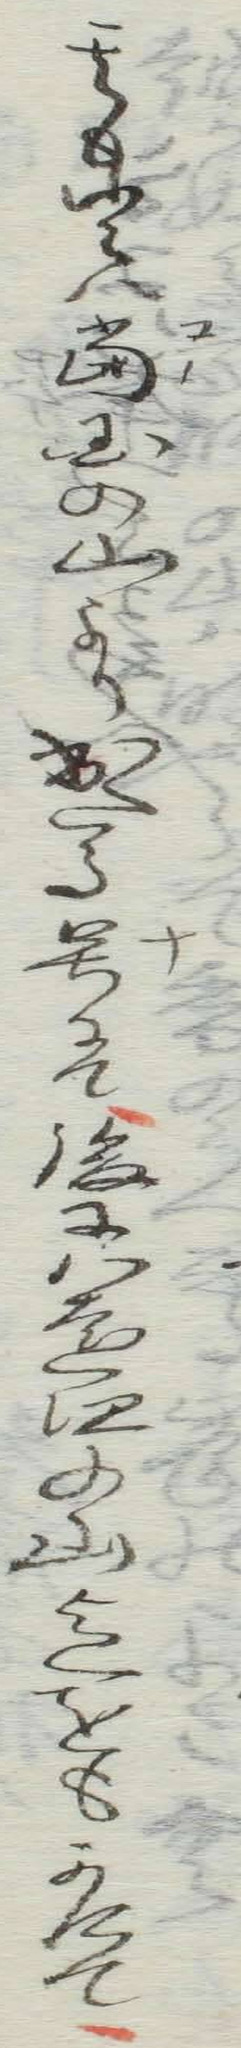其もとは当国の山より出たる号にて、後には遠江の山迄をもかけて、
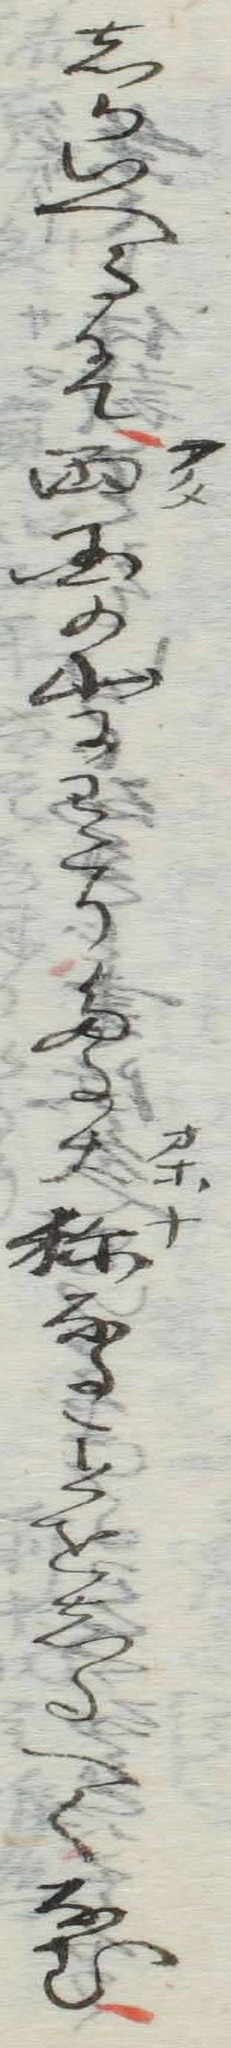しかいへるにて、両国の山にわたりたる大称なることをしるべくなむ、
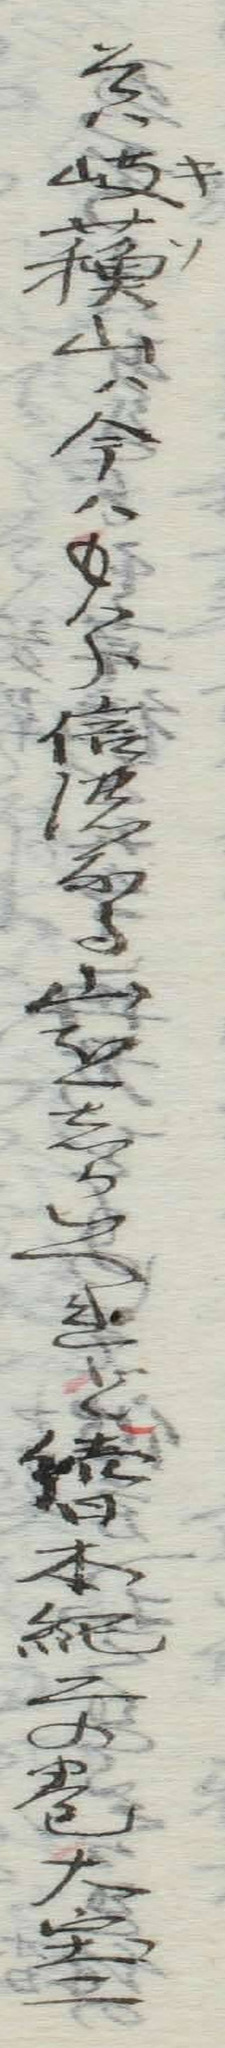そは岐蘇山は今はもはら信濃なる山をしかいへれど続日本紀二の巻大宝二
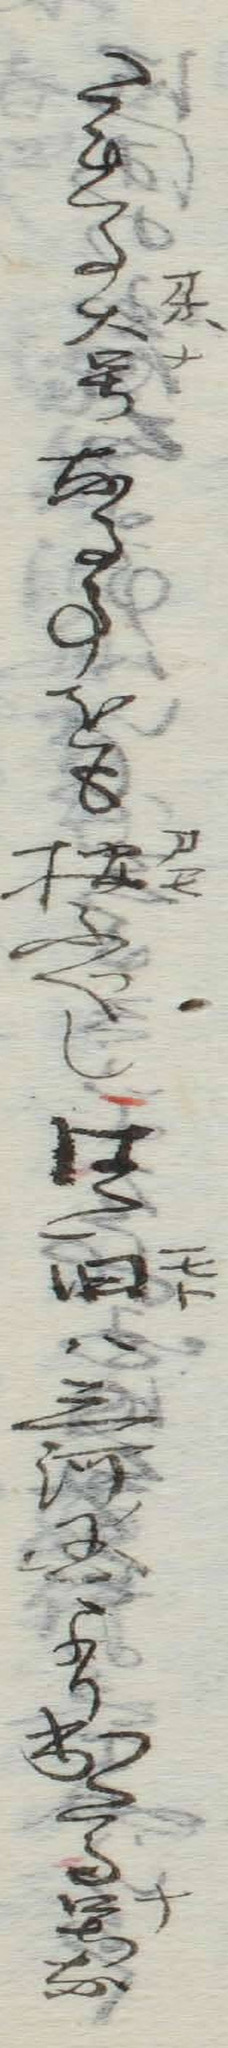たれる大号なる事をも按ふべし、はた旧は三河国より出たる号な
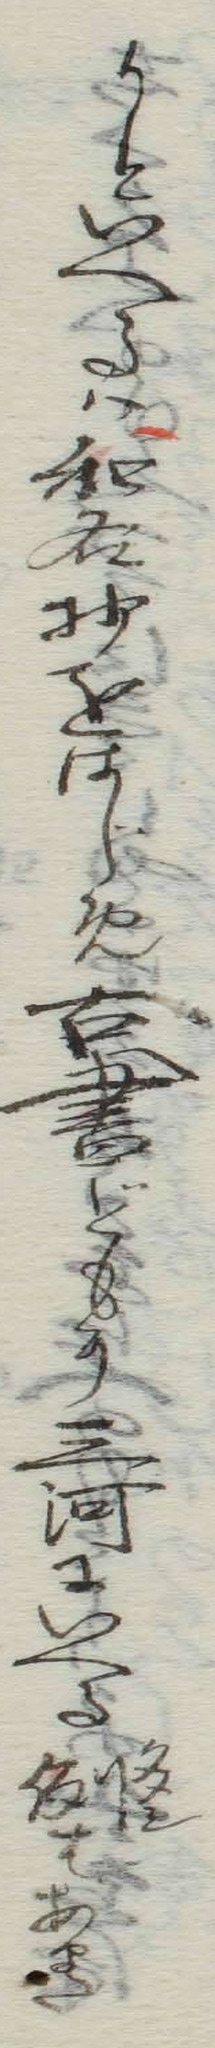りといへるは、和名抄をはじめ古へ書どもに三河にいへる例はあまた
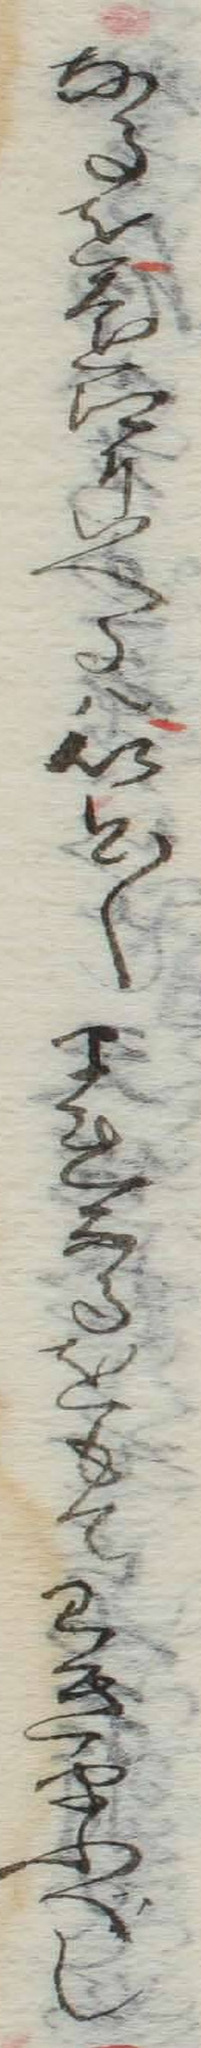なるを、遠江にいへるは、いと〳〵まれなるをもてわきまふべし、

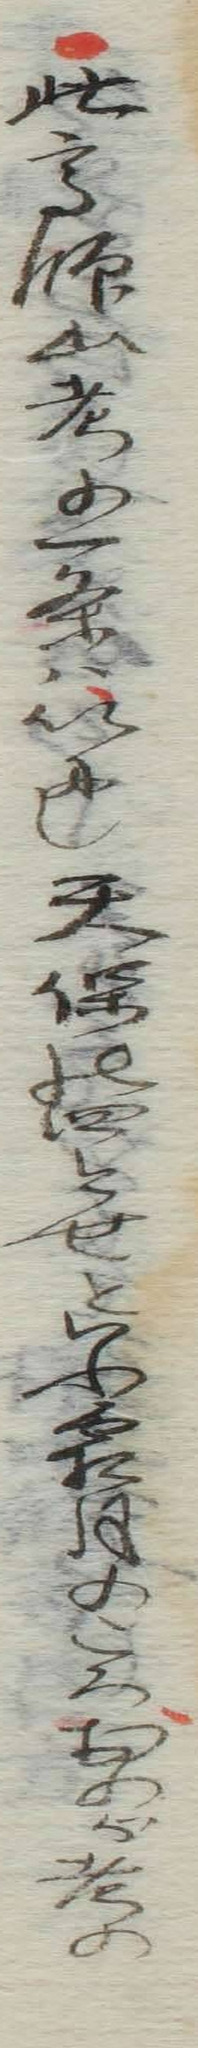●此高師山考の一条は、いにし天保の四とせといふ霜月のころ、おのが考の
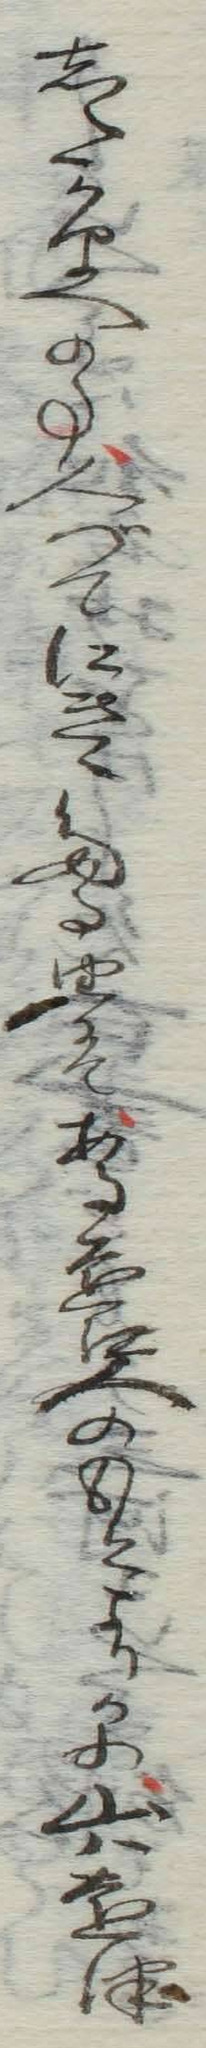したかまへの事、人づてにきゝたる由にて、ある遠江人のもとよりかの、山は遠津
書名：三河国古跡考
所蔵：国文学研究資料館
